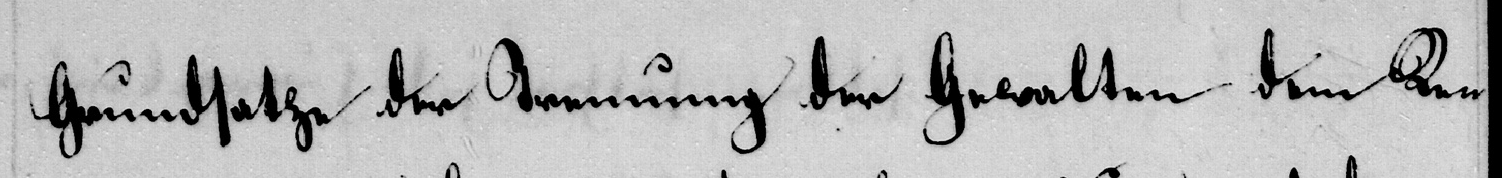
Grundsatze der Trennung der Gewalten dem Re¬
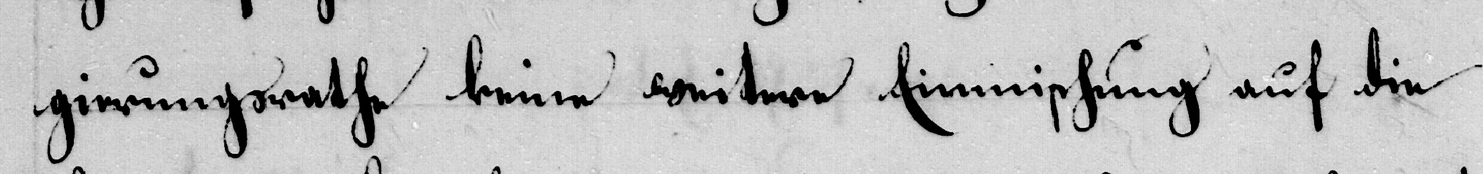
gierungsrathe keine weitere Einmischung auf die
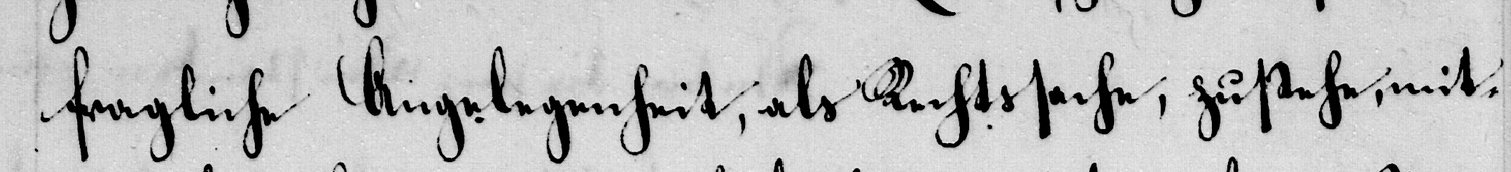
fragliche Angelegenheit, als Rechtssache, zustehe, mit¬
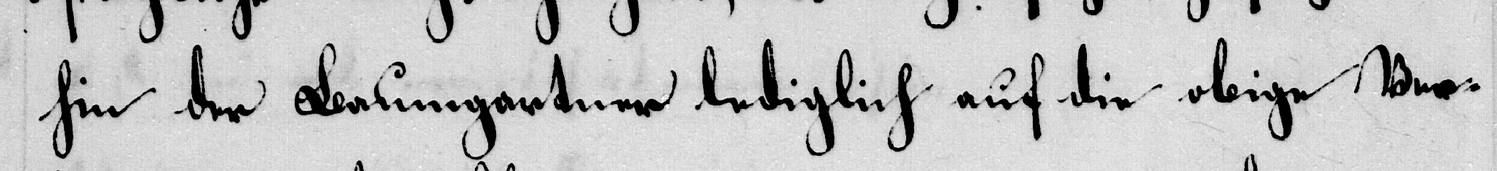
hin der Baumgartner lediglich auf die obige Ver¬
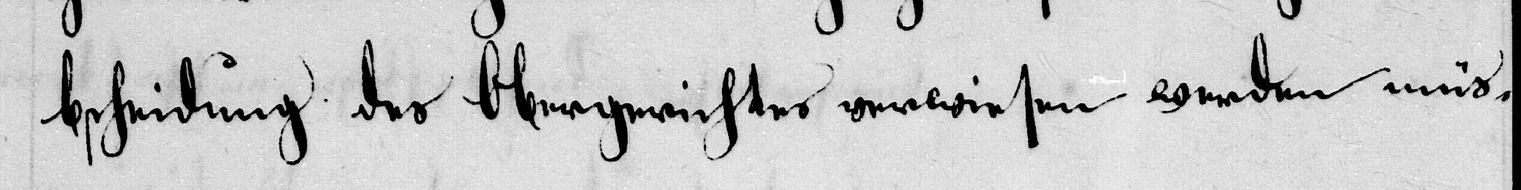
bscheidung des Obergerichtes verwiesen werden müß¬
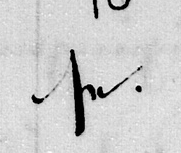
e.
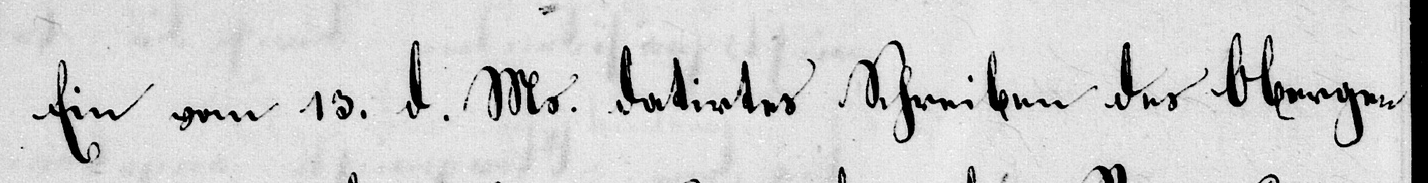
Ein vom 13. d. Ms. datirtes Schreiben des Oberge¬
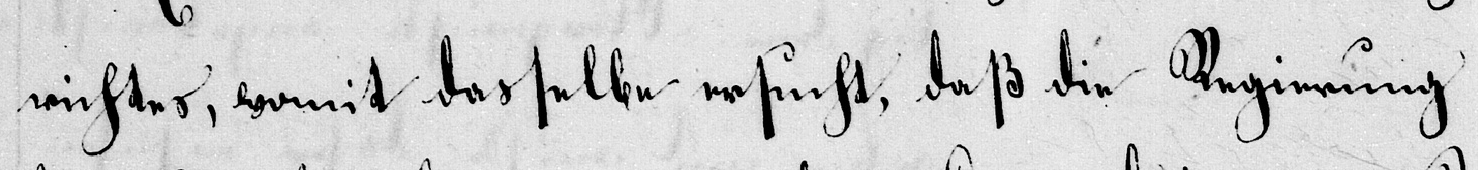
richtes, womit dasselbe ersucht, daß die Regierung
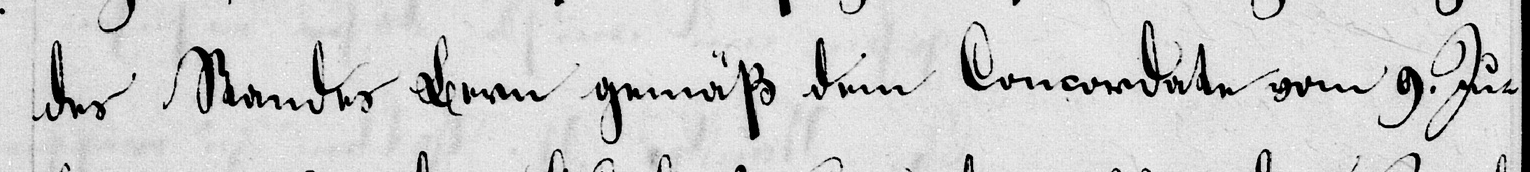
des Standes Bern gemäß dem Concordate vom 9. Ju¬
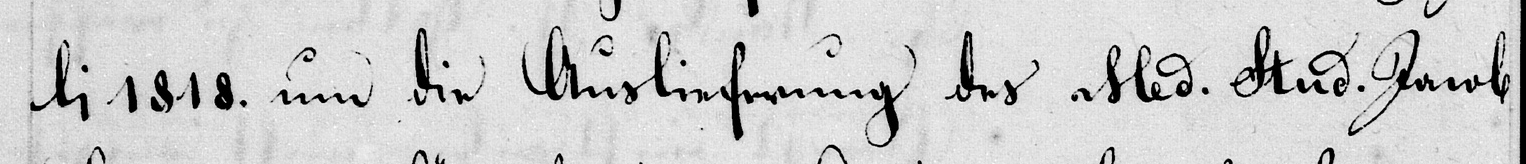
li 1818. um die Auslieferung des Med. Stud. Jacob
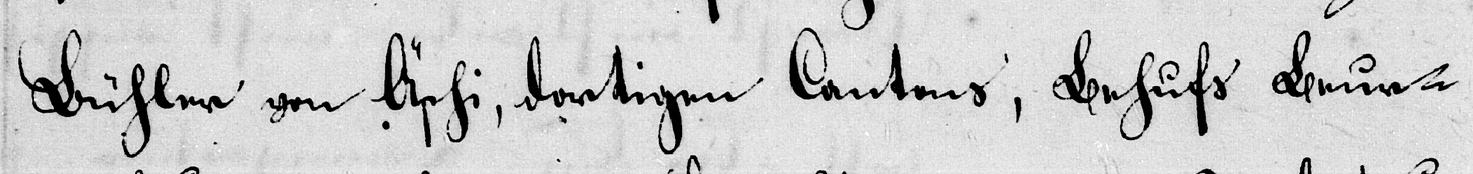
Bühler von Äschi, dortigen Cantons, Behufs Beur¬
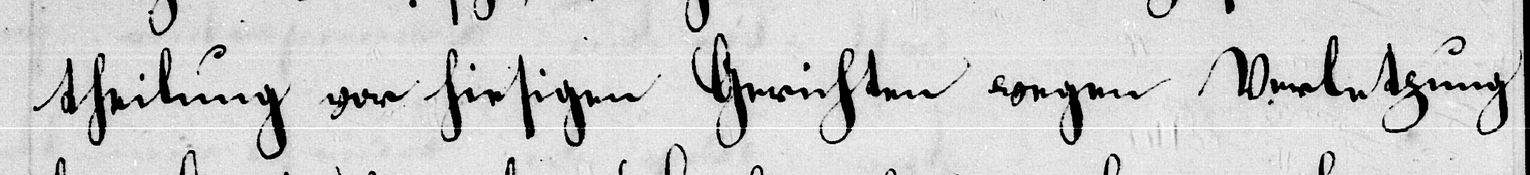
theilung vor hiesigen Gerichten wegen Verletzung
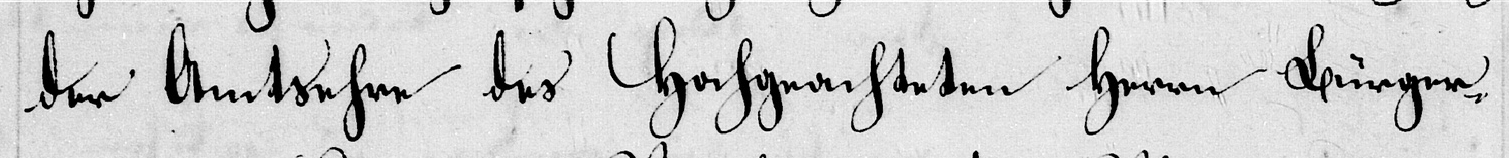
der Amtsehre des Hochgeachteten Herrn Bürger¬
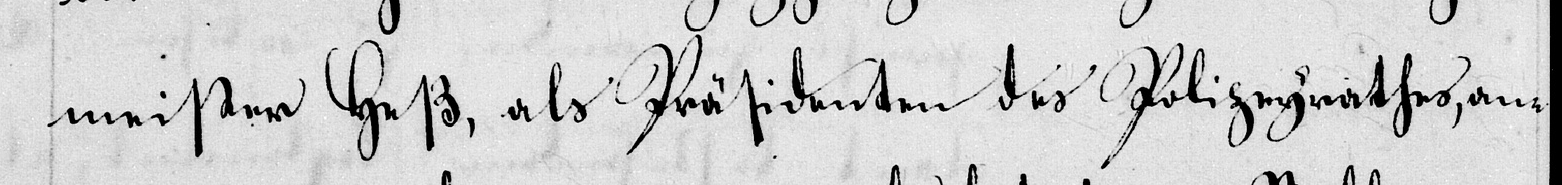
meister Heß, als Präsidenten des Polizeyrathes, an¬
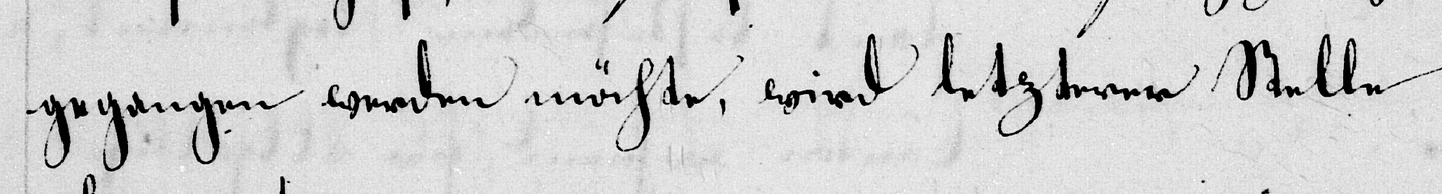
gegangen werden möchte, wird letzterer Stelle
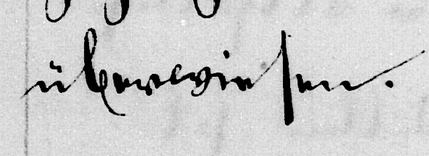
überwiesen.
